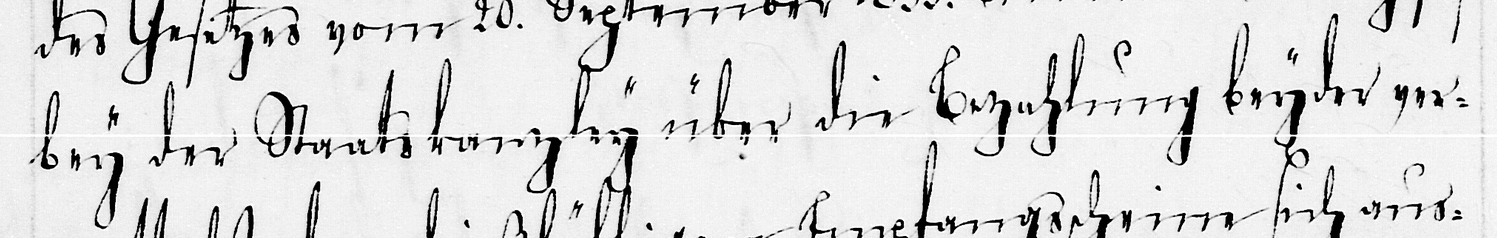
bey der Staatskanzley über die Bezahlung beyder ve¬
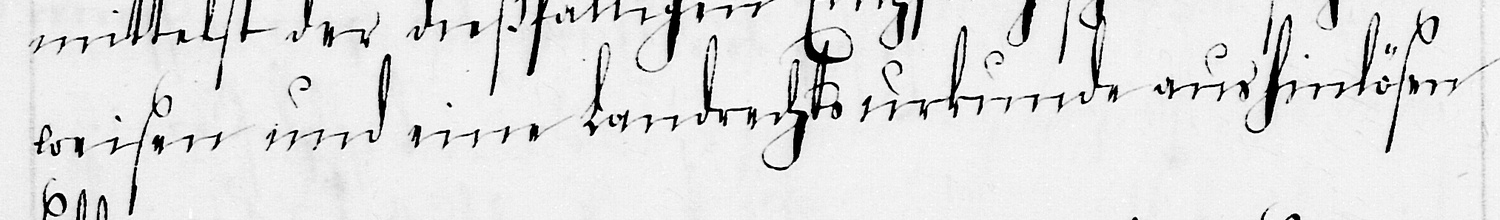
weisen und eine Landrechtsurkunde aushinlösen
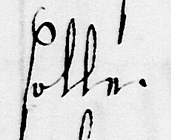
olle.
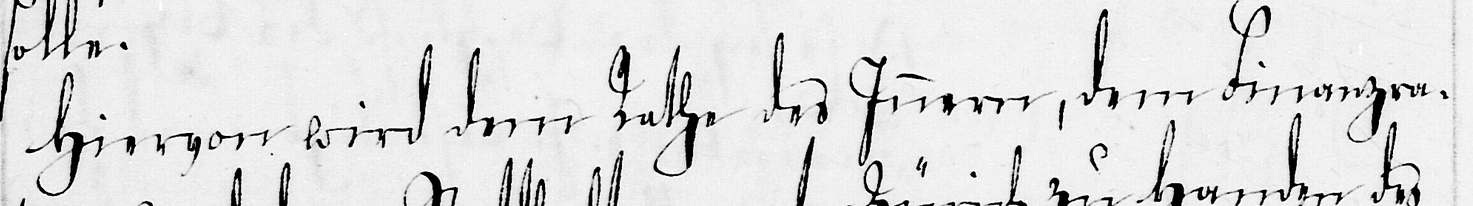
Hiervon wird dem Rathe des Innern, dem Finanzra¬
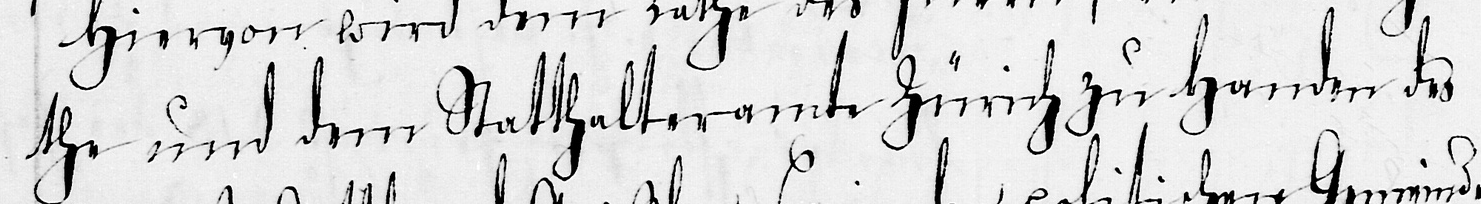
the und dem Statthalteramte Zürich zu Handen des
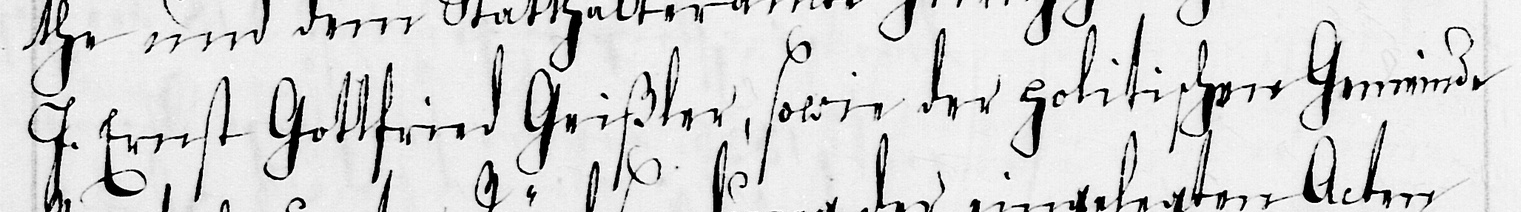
J. Ernst Gottfried Geißler, sowie der politischen Gemeinde
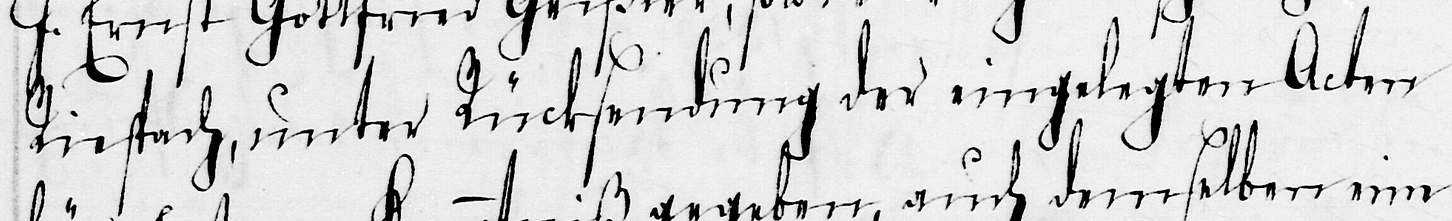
Riespach, unter Rücksendung der eingelegten Acten
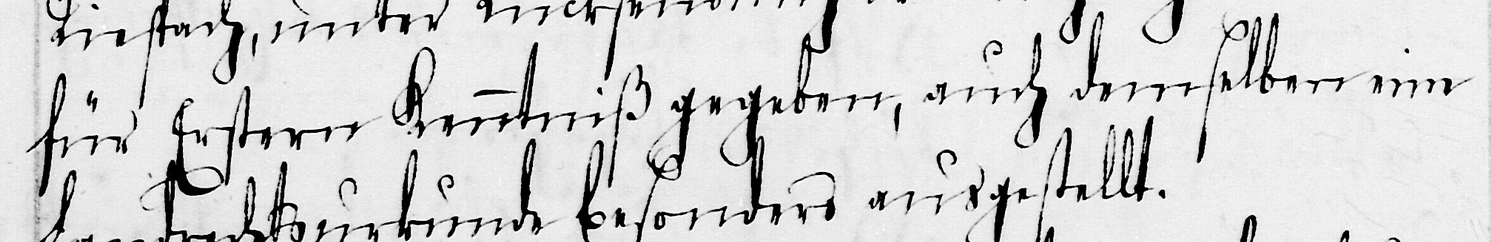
für Erstern Kenntniß gegeben, auch demselben eine
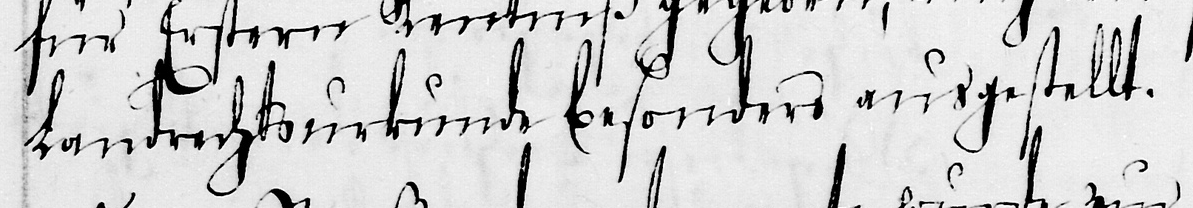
Landrechtsurkunde besonders ausgestellt.
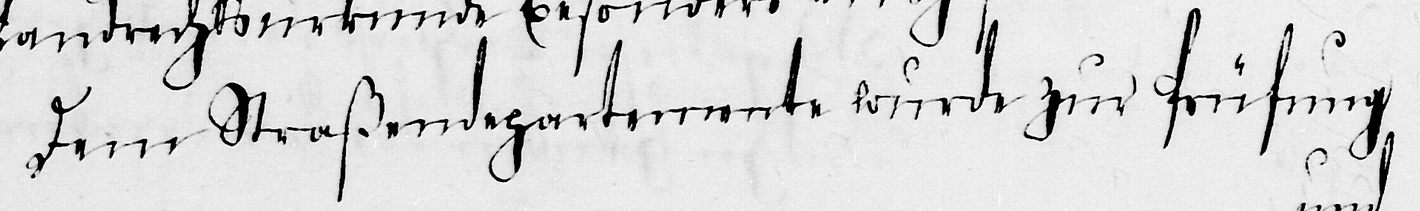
Dem Straßendepartemente wurde zur Prüfung
